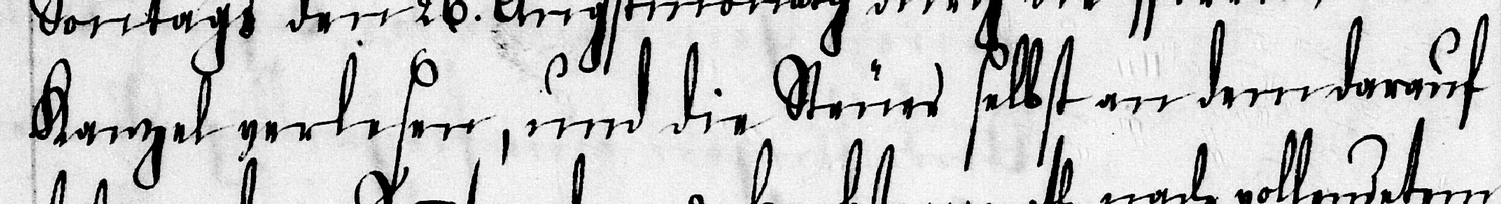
Kanzel verlesen, und die Steuer selbst an dem darauf
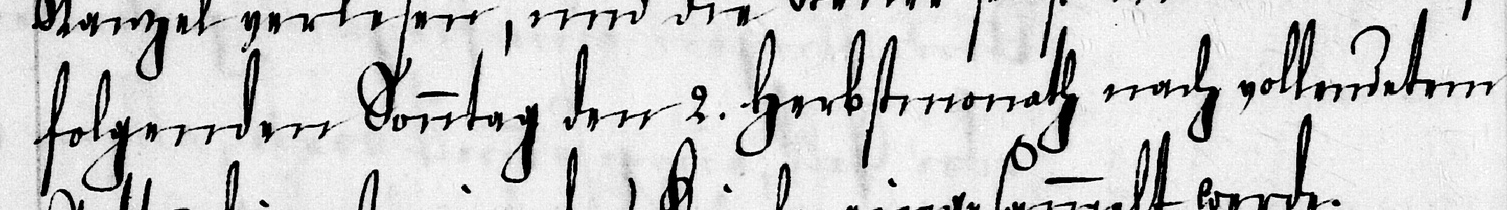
folgenden Sonntag den 2. Herbstmonath nach vollendetem
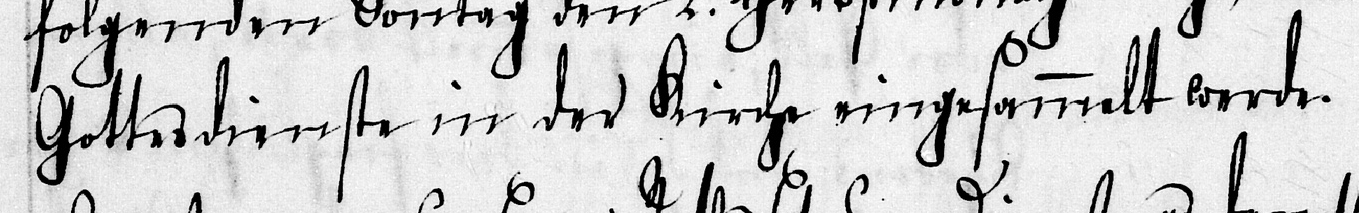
Gottesdienste in der Kirche eingesammelt werde.
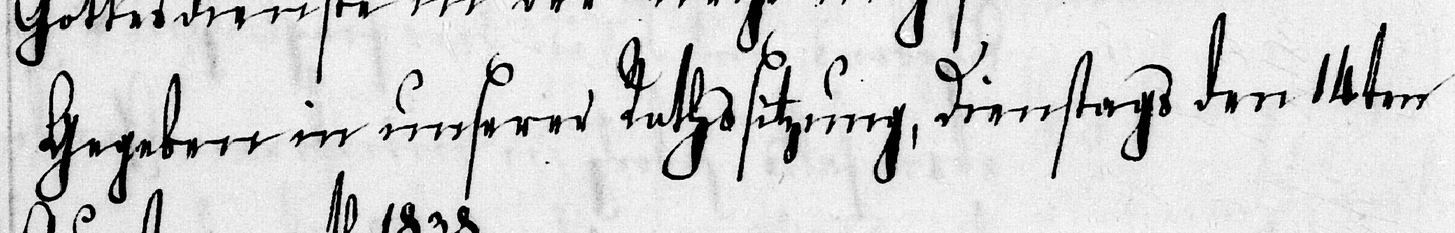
Gegeben in unserer Rathssitzung, Dienstags den 14ten
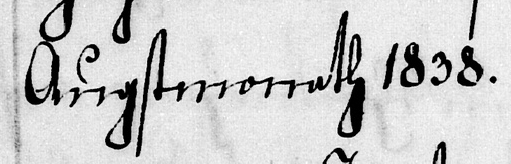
Augstmonath 1838.
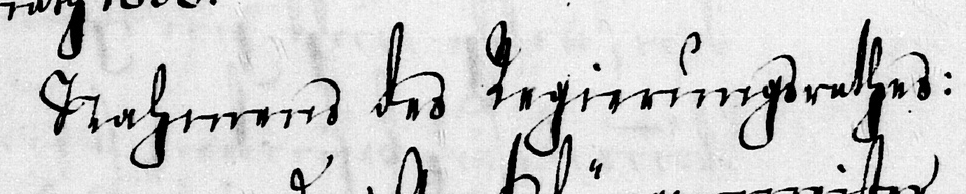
Nahmens des Regierungsrathes:
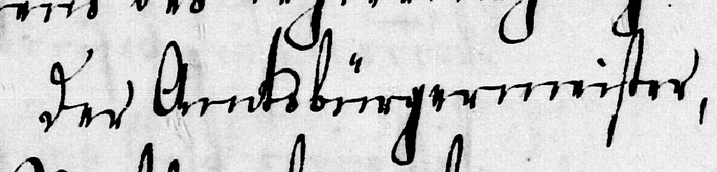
Der Amtsbrügermeister,
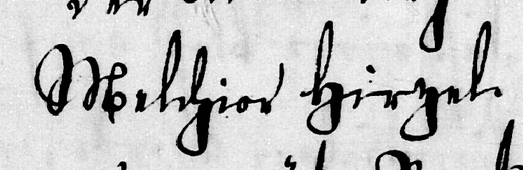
Melchior Hirzel.
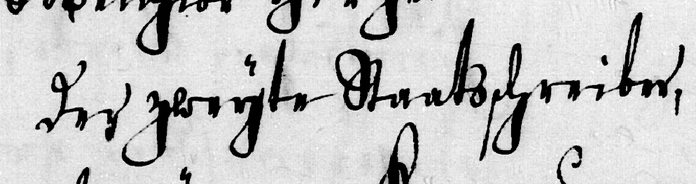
Der zweyte Staatsschreiber,
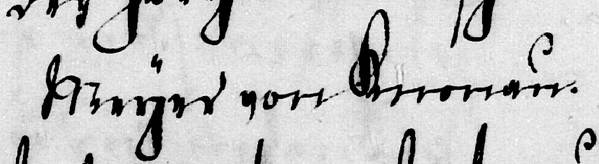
Meyer von Knonau.
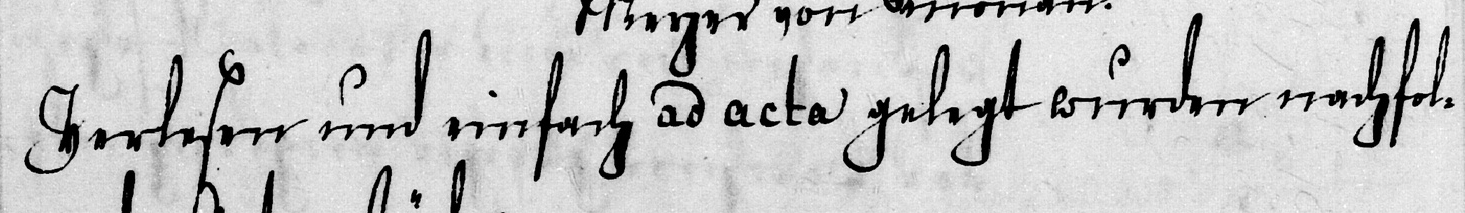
Verlesen und einfach ad acta gelegt wurden nachfo¬
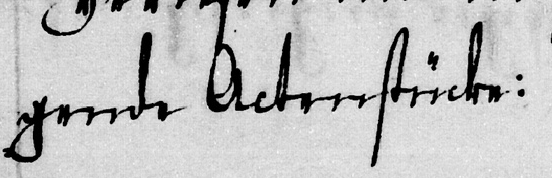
lgende Actenstücke:
